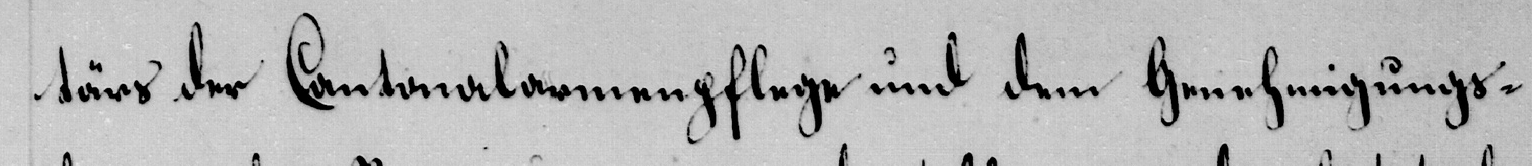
tärs der Cantonalarmenpflege und dem Genehmigungs¬
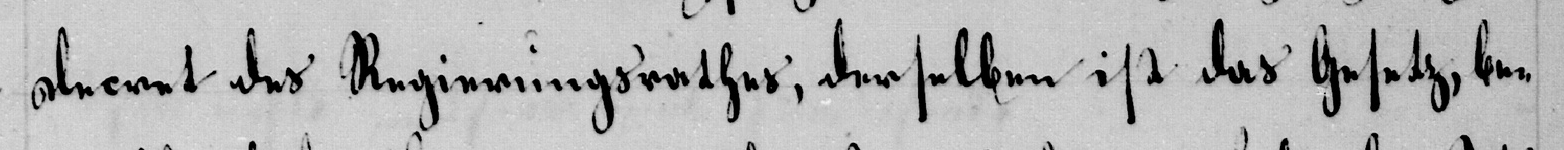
decret des Regierungsrathes, derselben ist das Gesetz, be¬
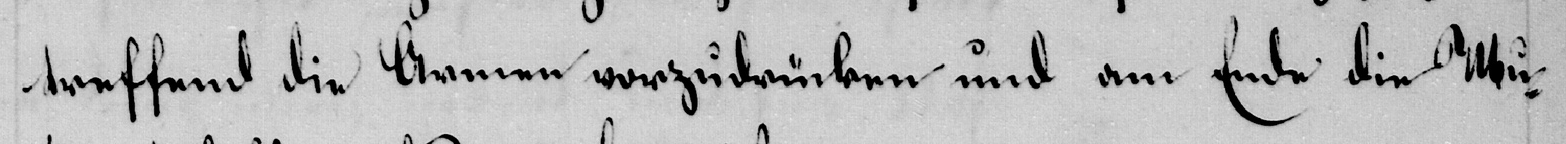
treffend die Armen vorzudrücken und am Ende die Mu¬
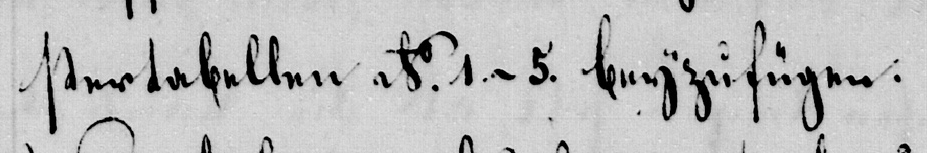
stertabellen No. 1.–5. beyzufügen.
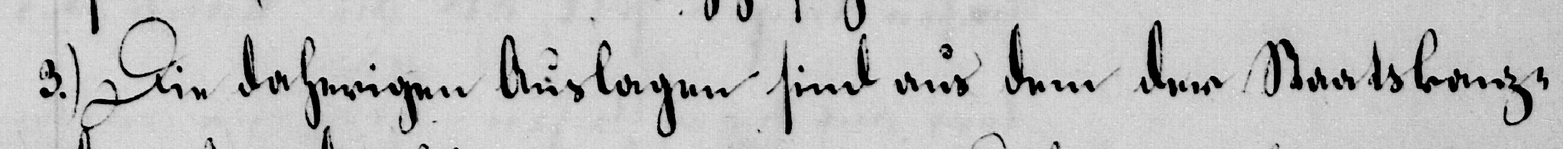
3.) Die daherigen Auslagen sind aus dem der Staatskanz¬
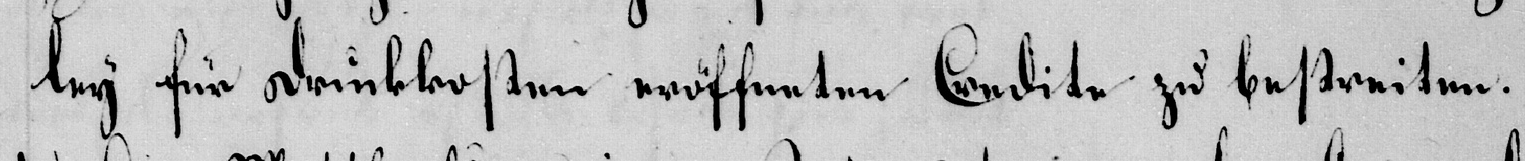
ley für Druckkosten eröffneten Credite zu bestreiten.
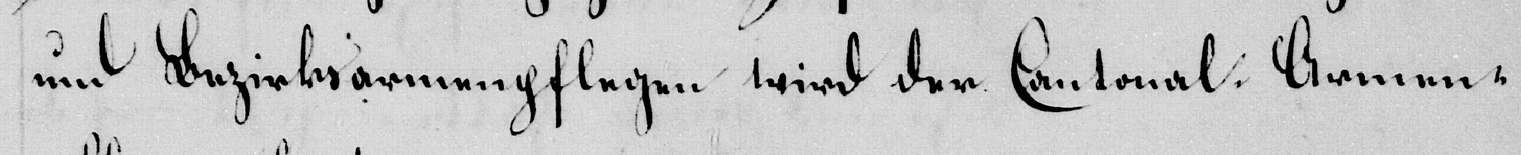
und Bezirksarmenpflegen wird der Cantonal-Armen¬
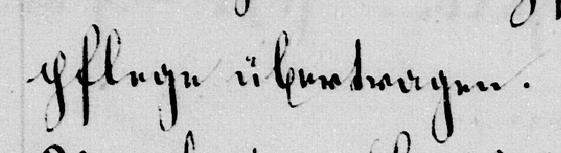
pflege übertragen.
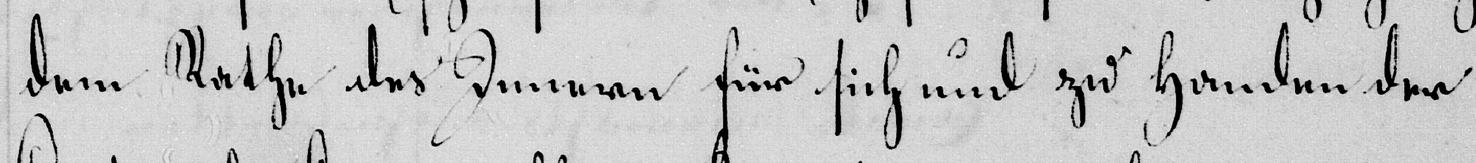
dem Rathe des Innern für sich und zu Handen der
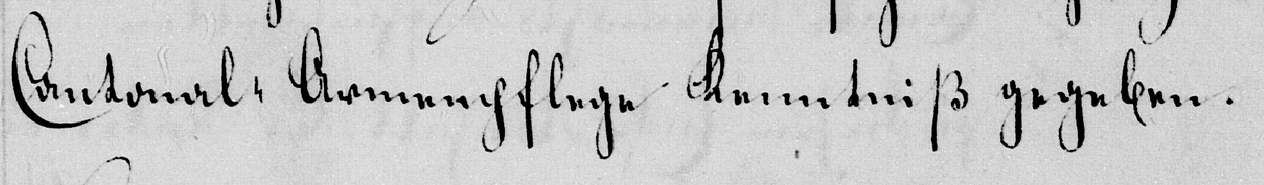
Cantonal-Armenpflege Kenntniß gegeben.
